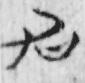加
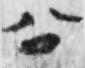公
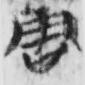周
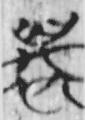蠆
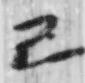己
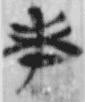未
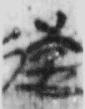遊
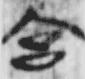宮
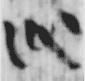州
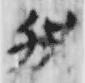加
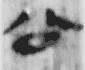公
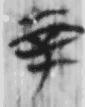辛
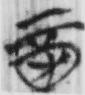酉
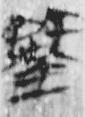篁
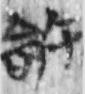○（令）
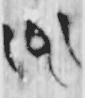州
